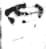月
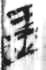○（建）
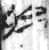於
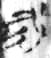戌
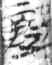○（陷）
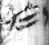於
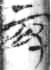亥
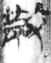○（破）
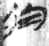於
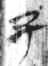子
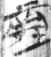坪（平）
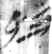於
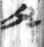丑
